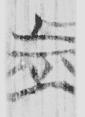者
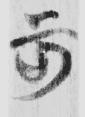可
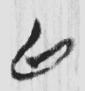㠯（以）
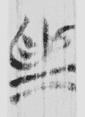爲
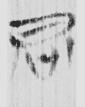君
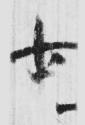才
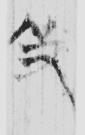及
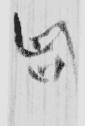句
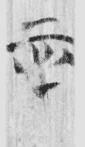辛
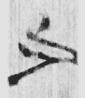之
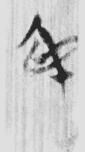身
